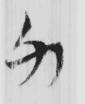力
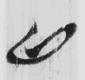㠯（以）
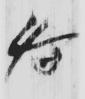左
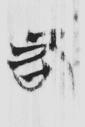右
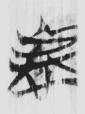者
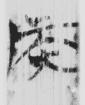侯
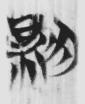則
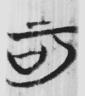可
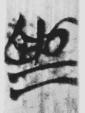爲
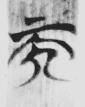而
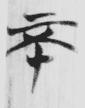不
